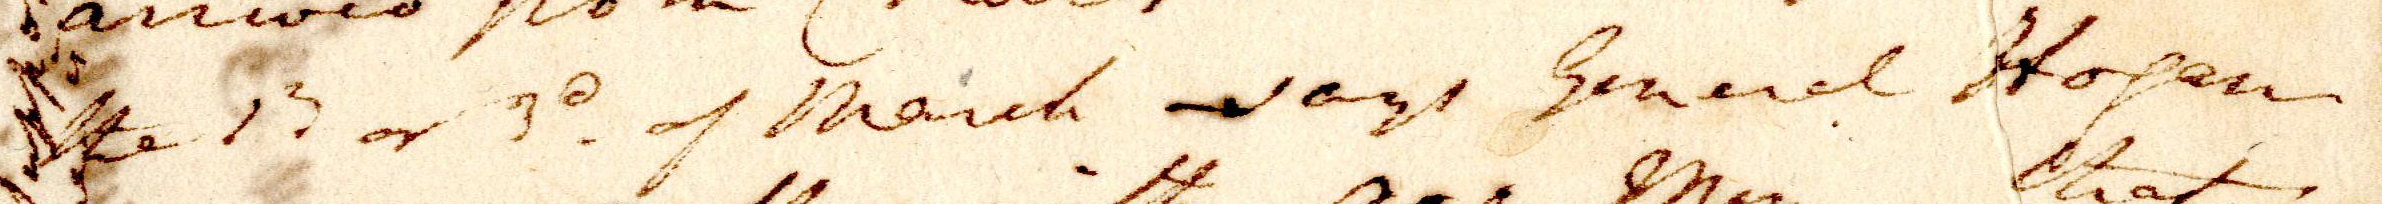Ife 1^st or 3^d. of March says General Hogen
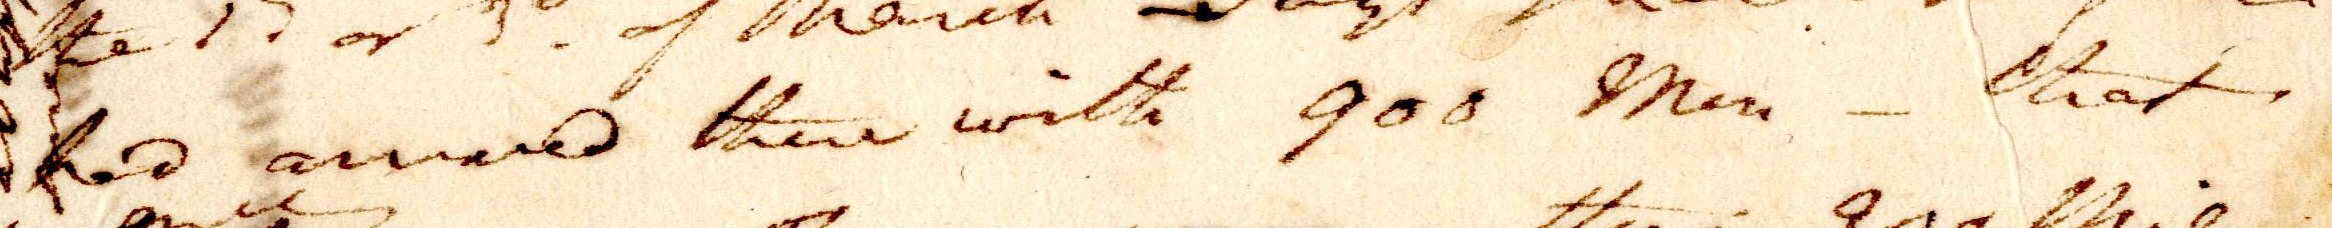had arrived there with 900 Men. That
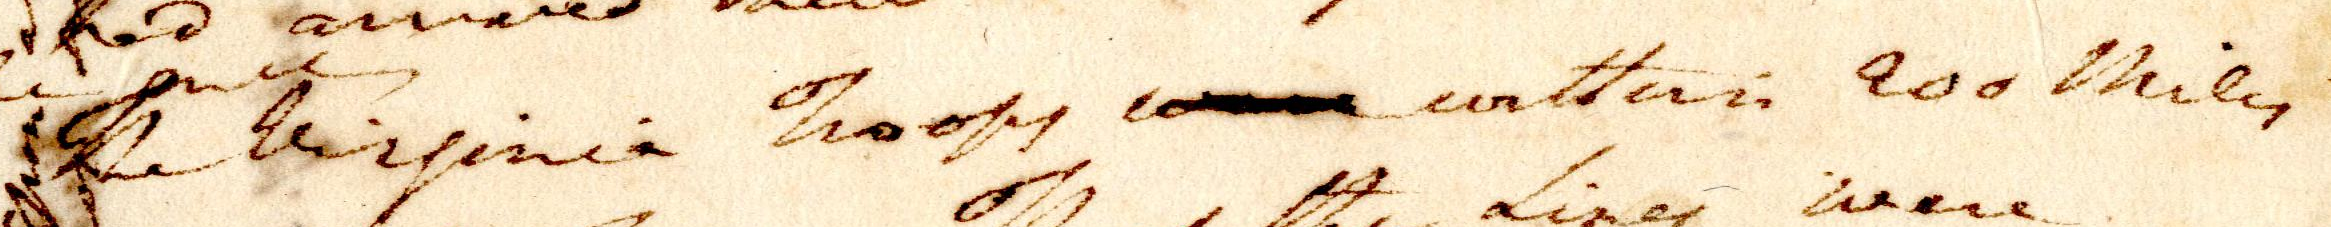The Virginia Troops [__] written 200 Miles
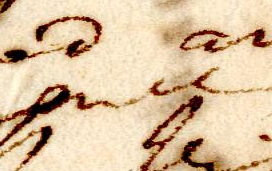once
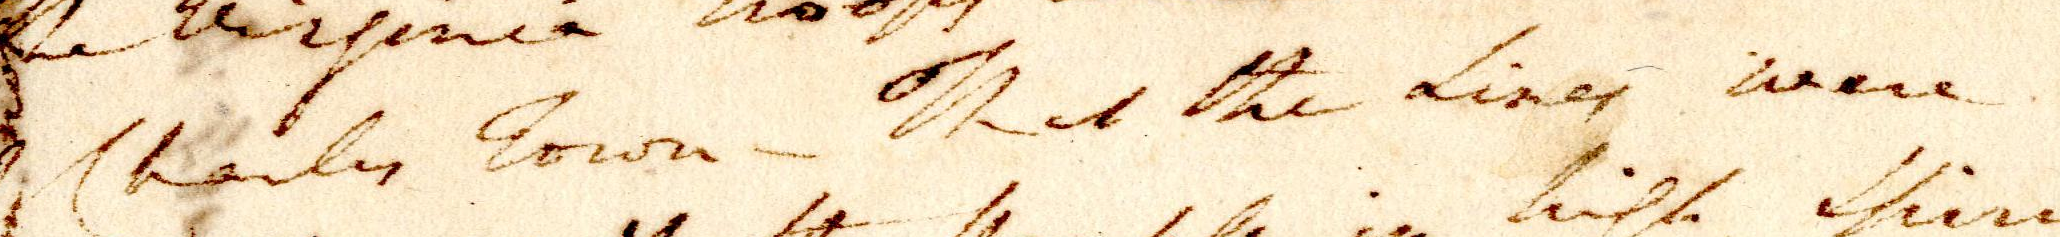Charles Town. That the Lines were
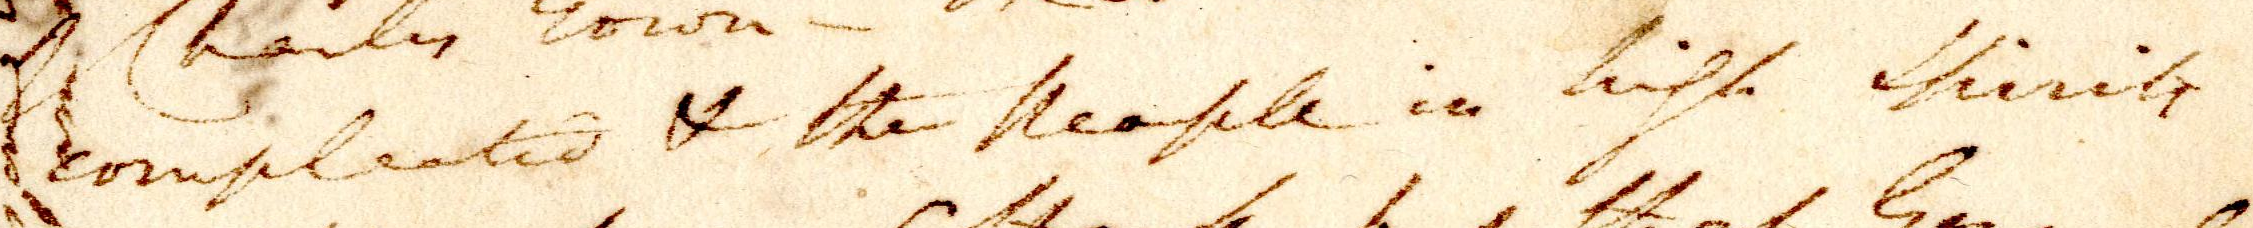compleated & the People in high Spirits
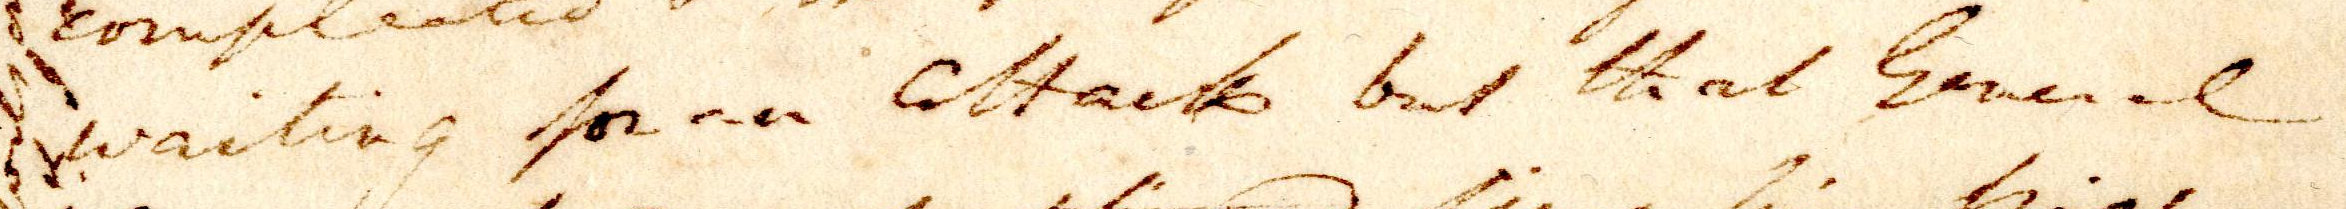waiting for an attack but that General
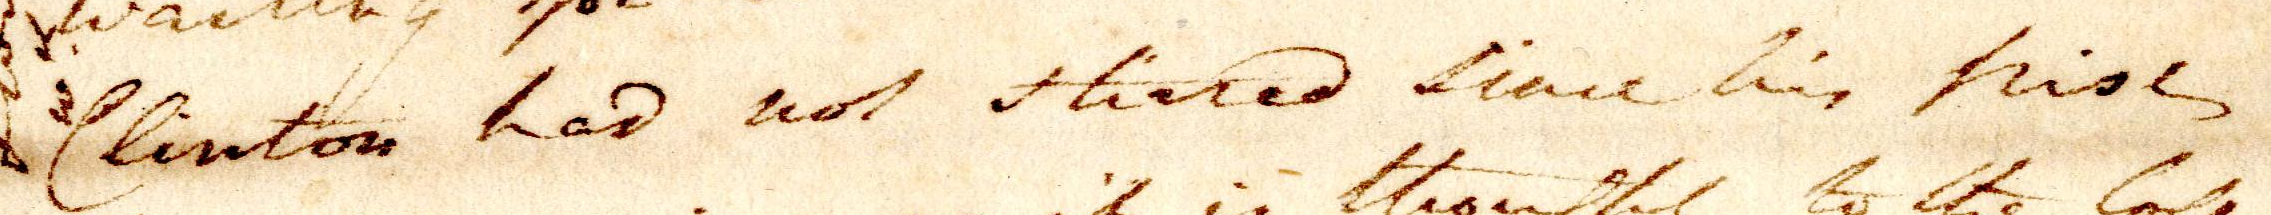Clinton had not shared since his first
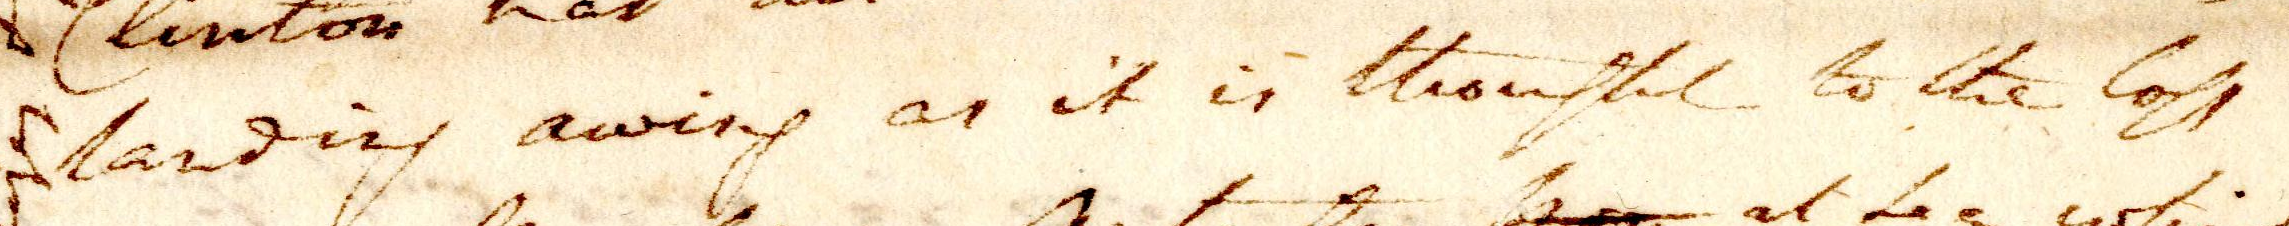landing awing as it is thought to the loss
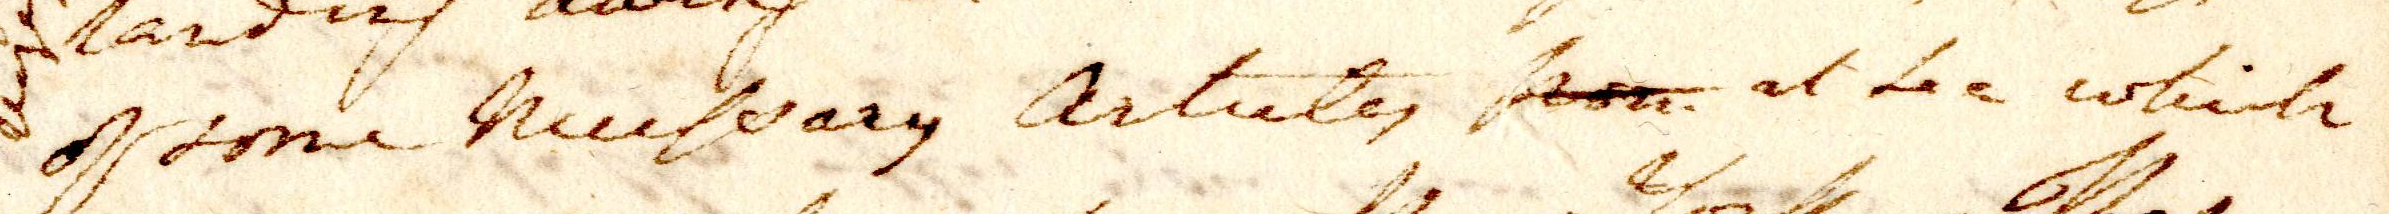of some Necessary Articles from at Lee which
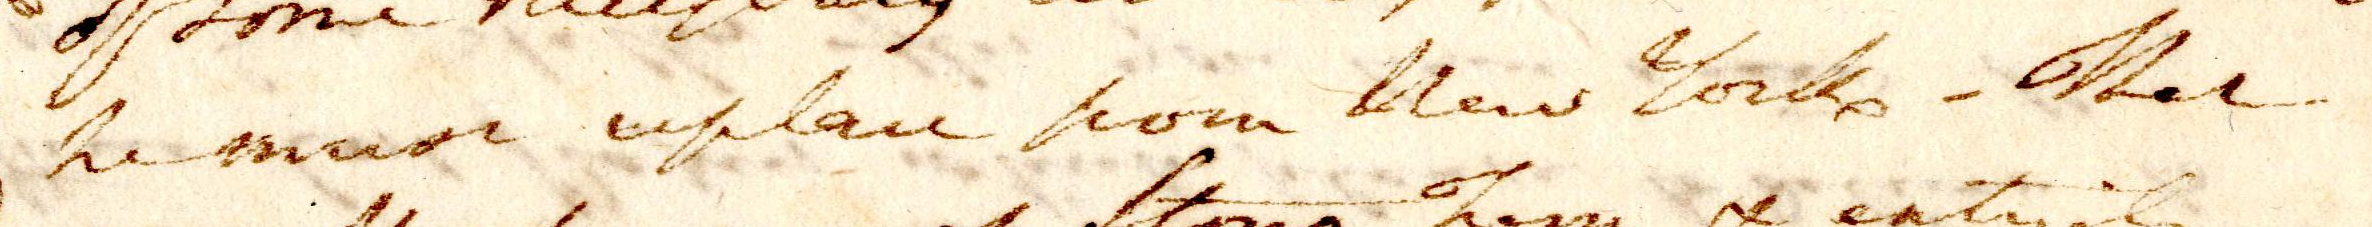he must replace from New York. Their
